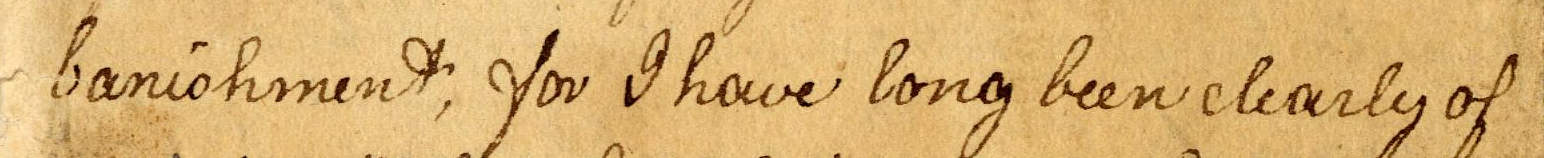banishment, for I have long been clearly of
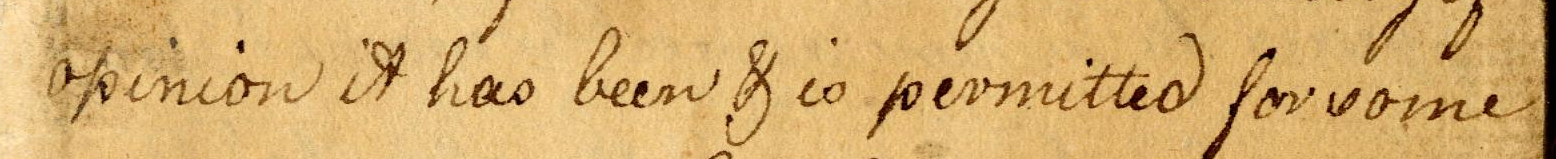opinion it has been & is permitted for some
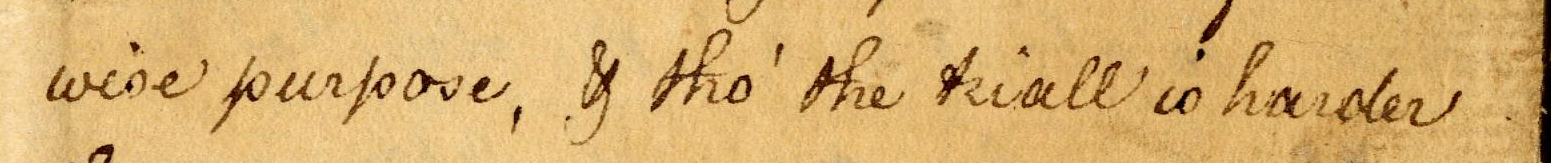wise purpose, & tho' the triall is harder
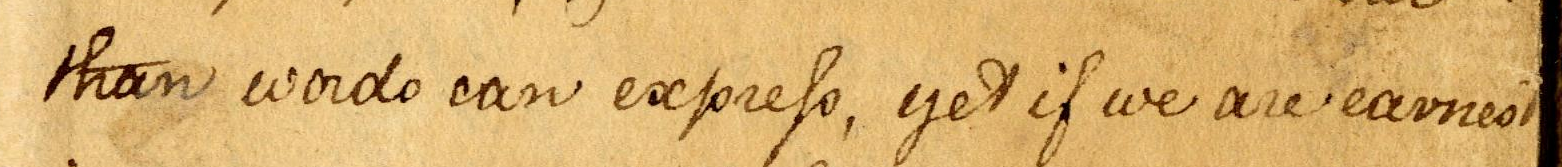than words can express, yet if we are earnest
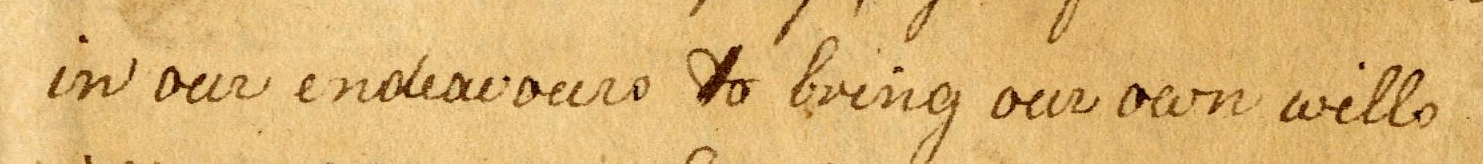in our endeavours to bring our own wills
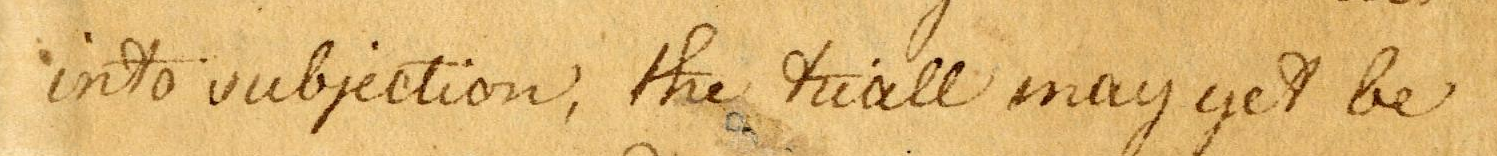into subjection, the triall may yet be
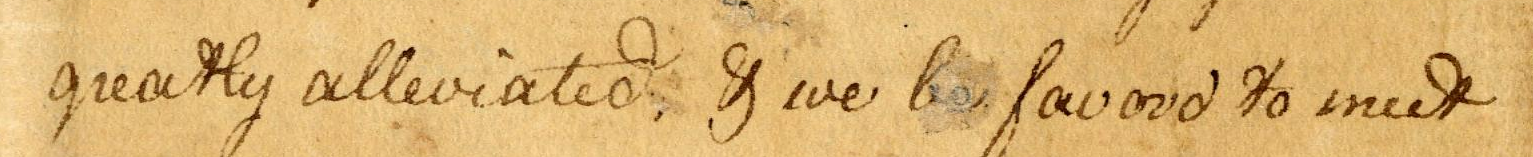greatly alleviated, & we be favord to meet
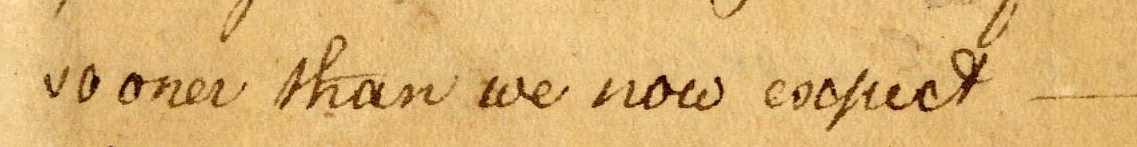sooner than we now expect-
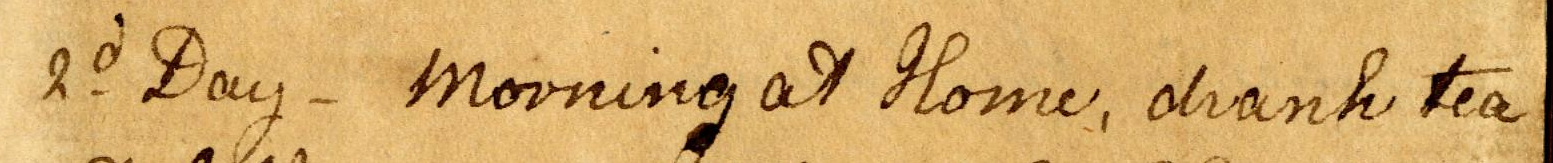2^d. Day- Morning at Home, drank tea
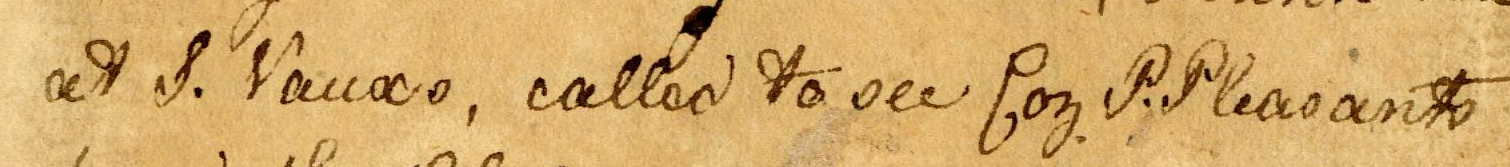at S. Vauxs, called to see Coz P. Pleasants
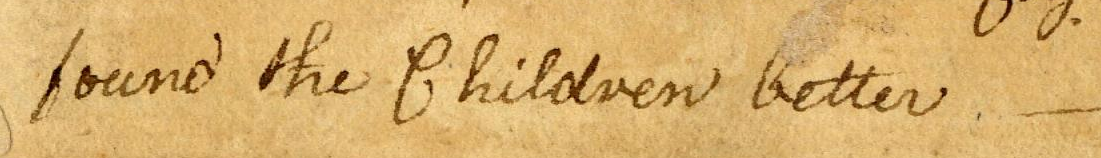found the Children better-
